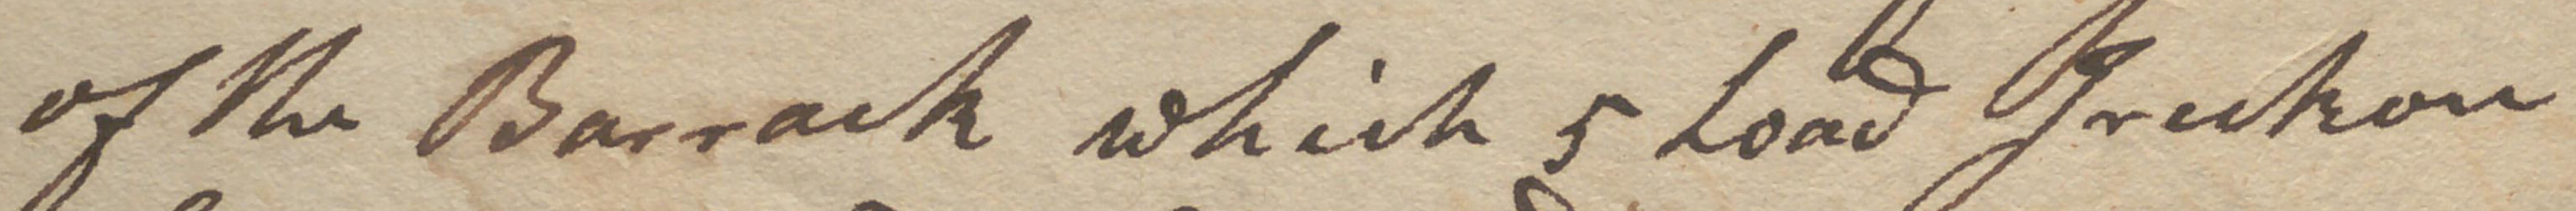of the Barrack which 5 Load I reckon
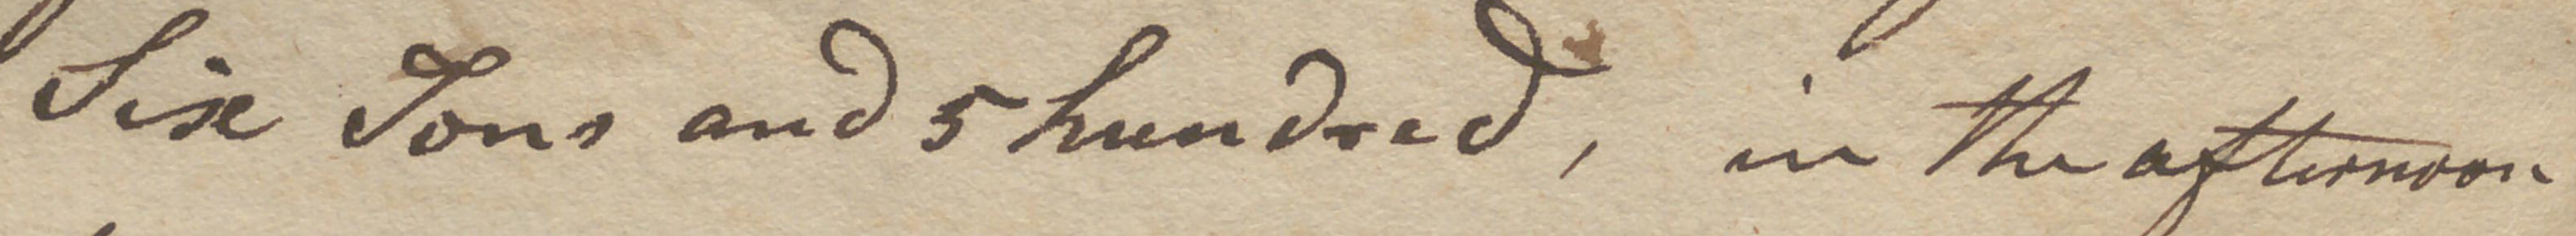Six Tons and 5 hundred, in the afternoon
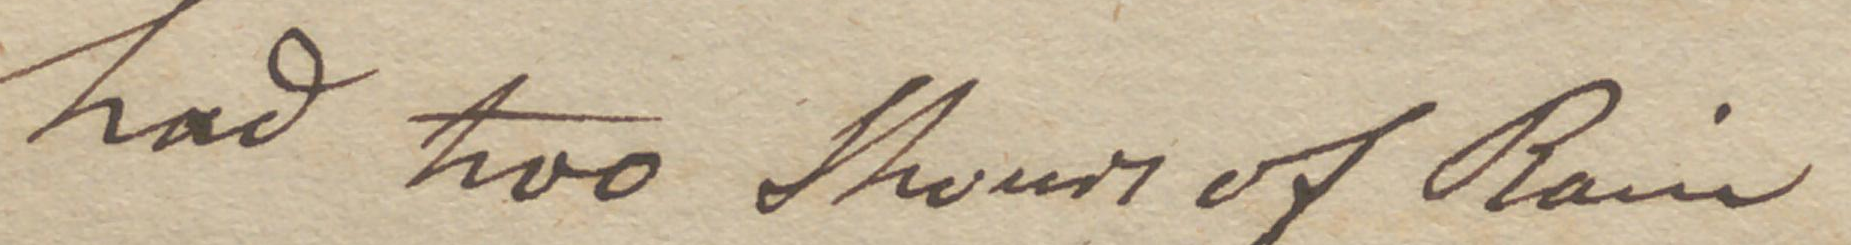had two Shours of Rain
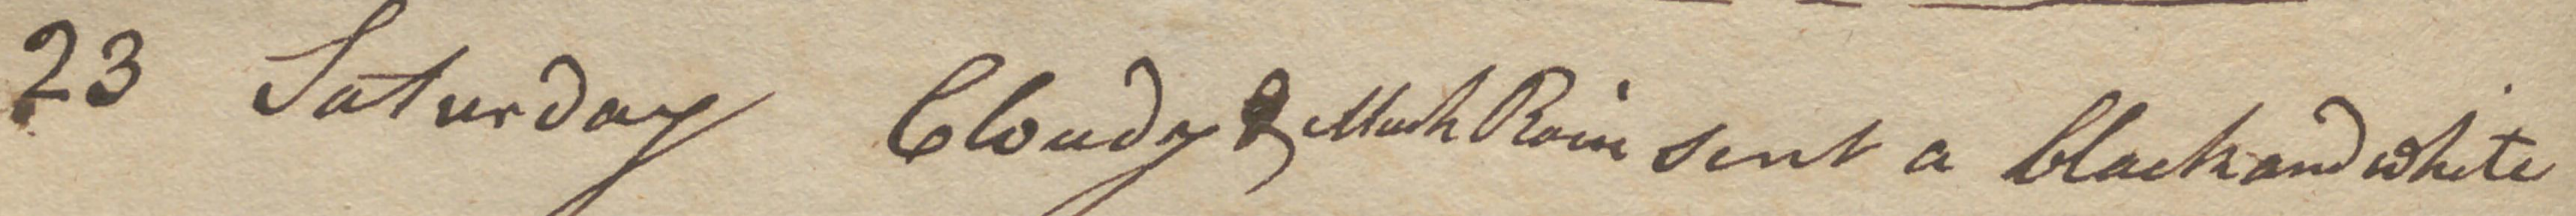23 Saturday Cloudy & Much Rain sent a black and white
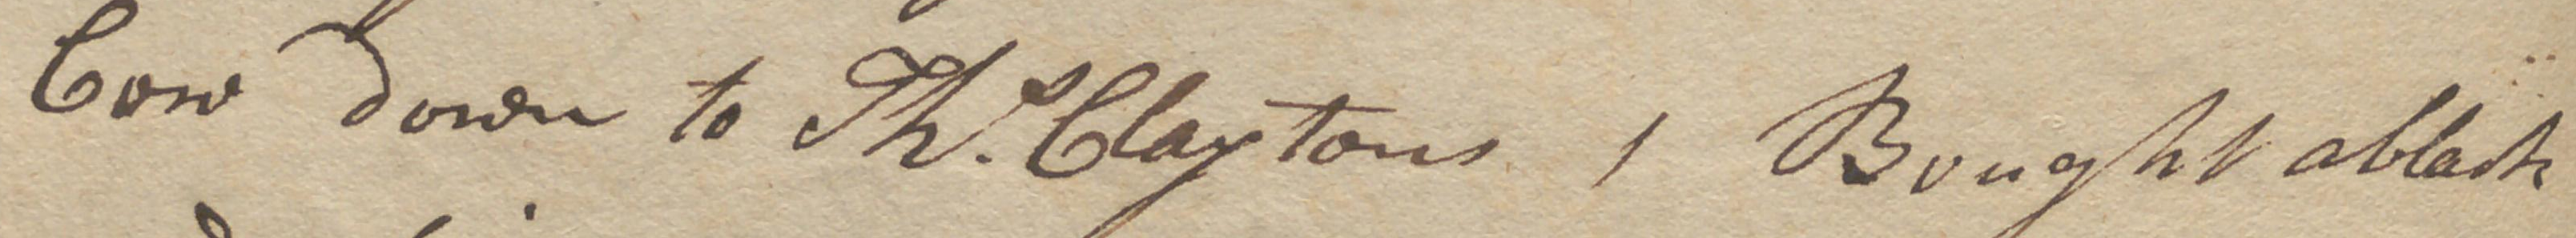Cow down to Th^o. Claytons, Bought a black
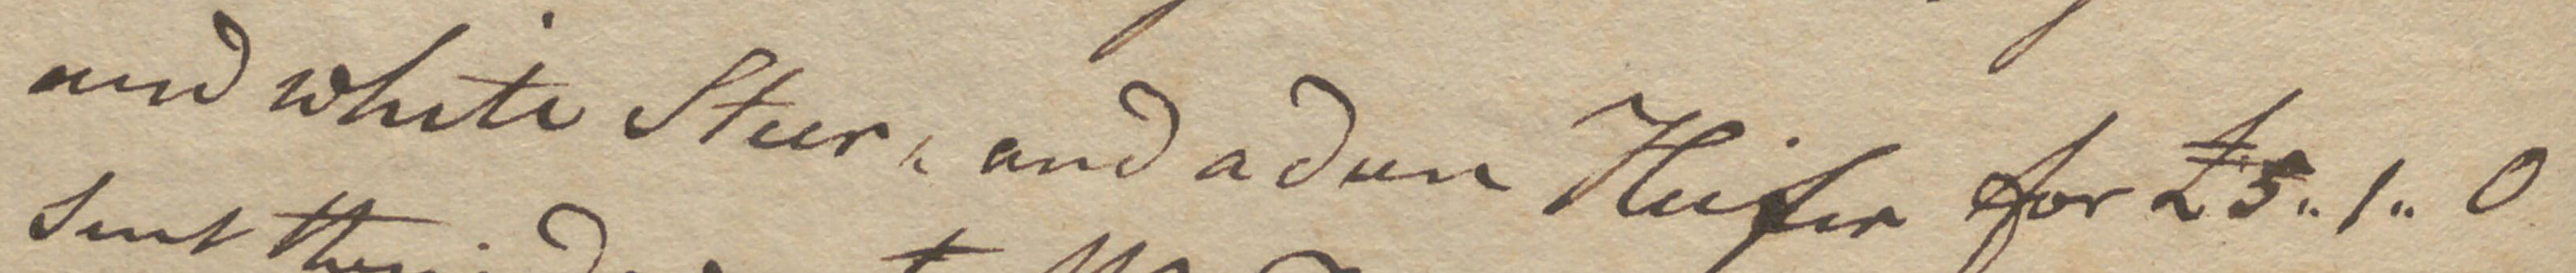and white Steer and a dun Heifer for £5.1.0
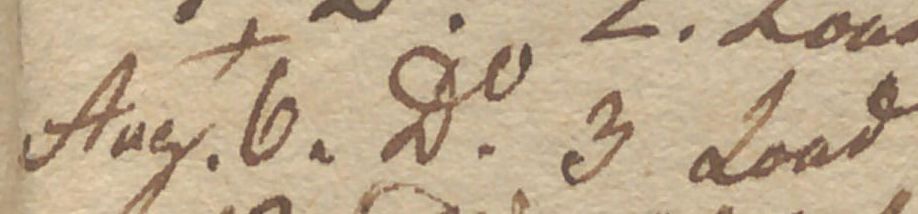Aug^t. 6. D^o. 3 Load
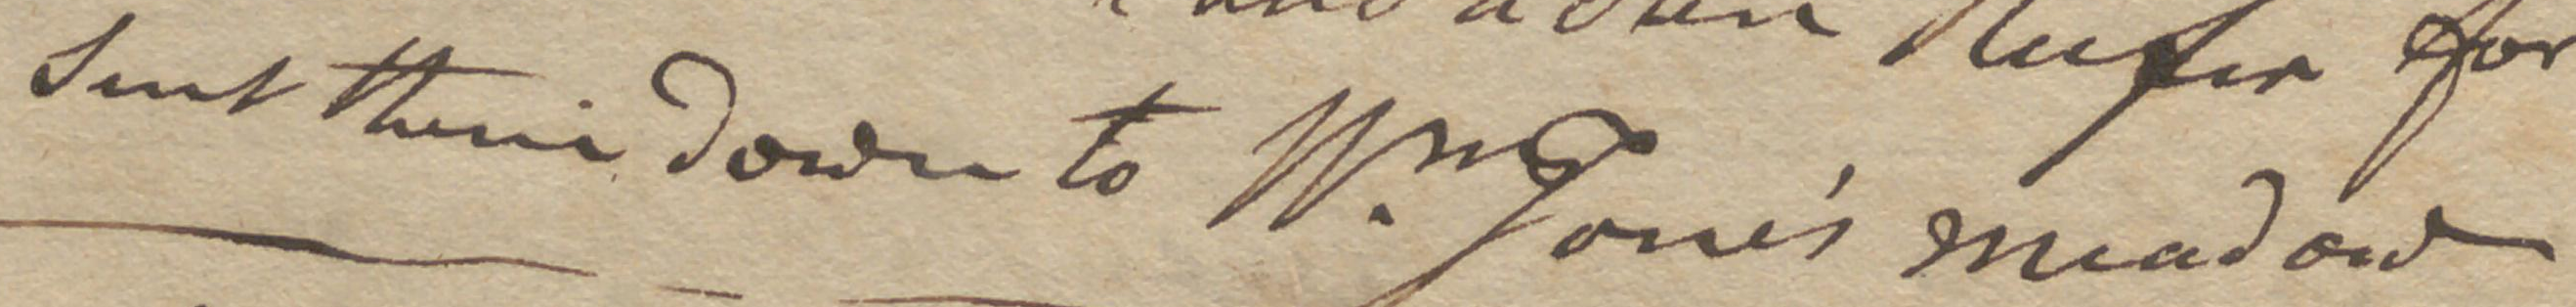sent them down to W^m. Jone's meadow
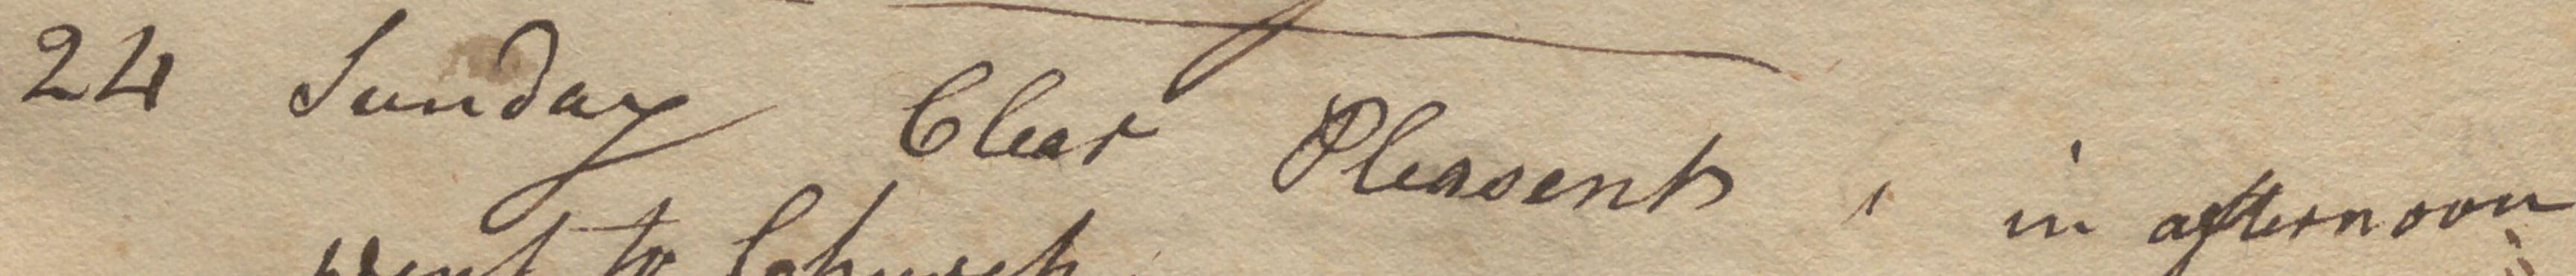24 Sunday, Clear Pleasent, in afternoon
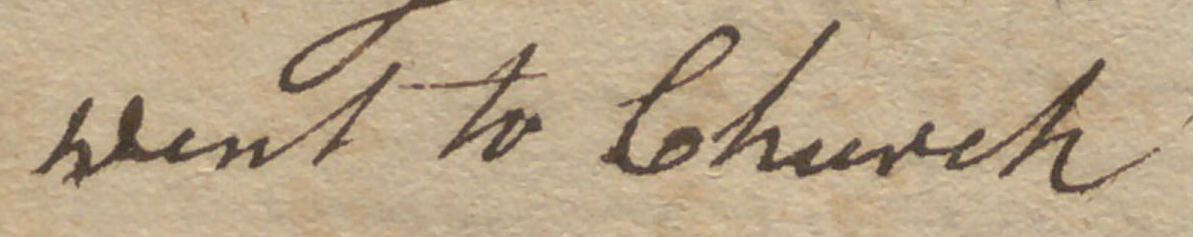went to Church
